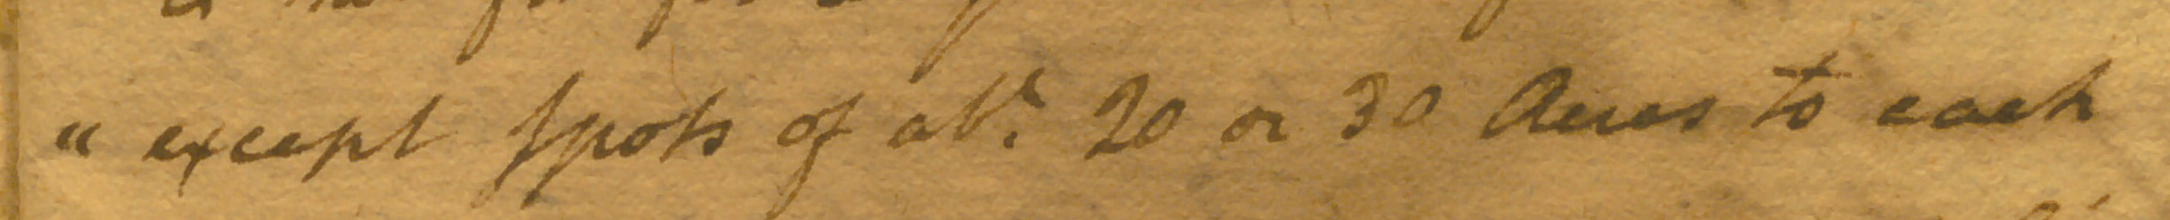"except spots of ab^t. 20 or 30 acres to each
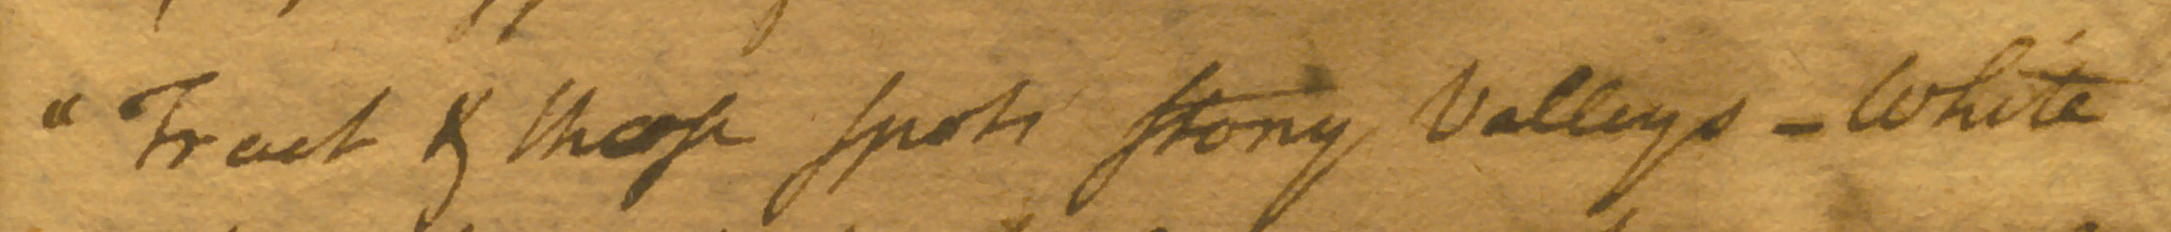"Tract & those spots stony valleys- white
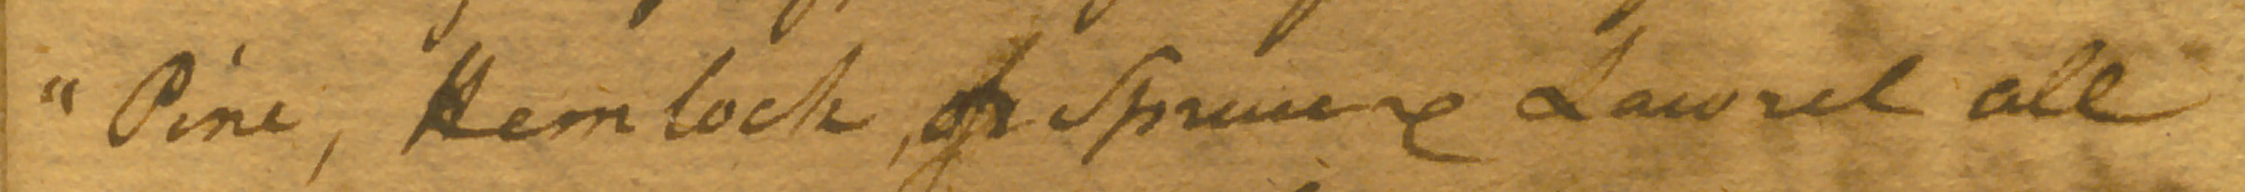"Pine, Hemlock or Spruce Laurel all
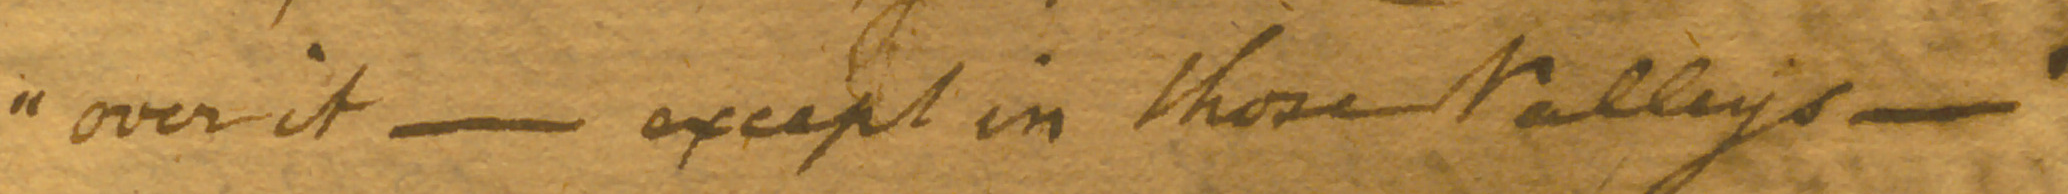"over it- except in those Valleys-
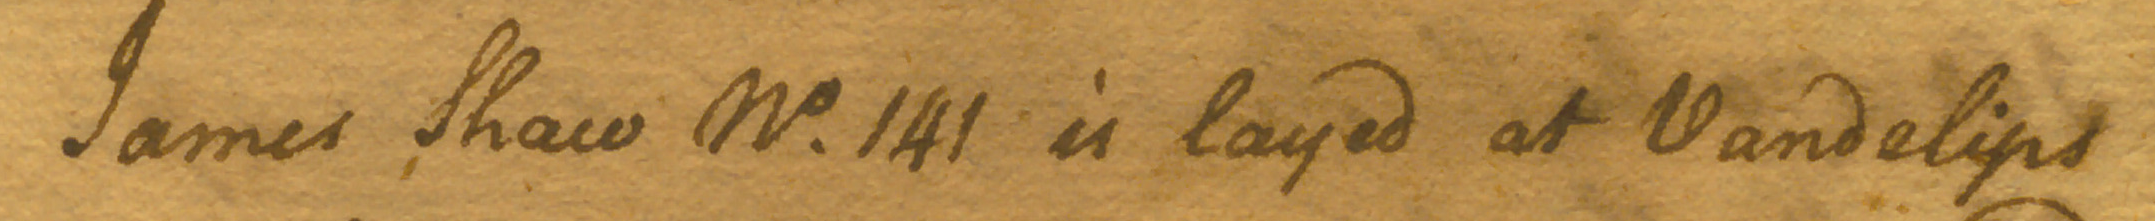James Shaw N^o. 141 is layed at Vandelips
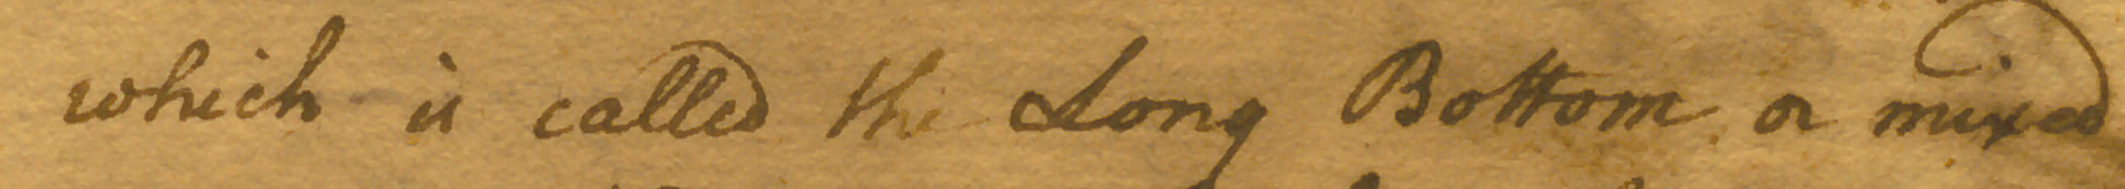which is called the Long Bottom or mixed
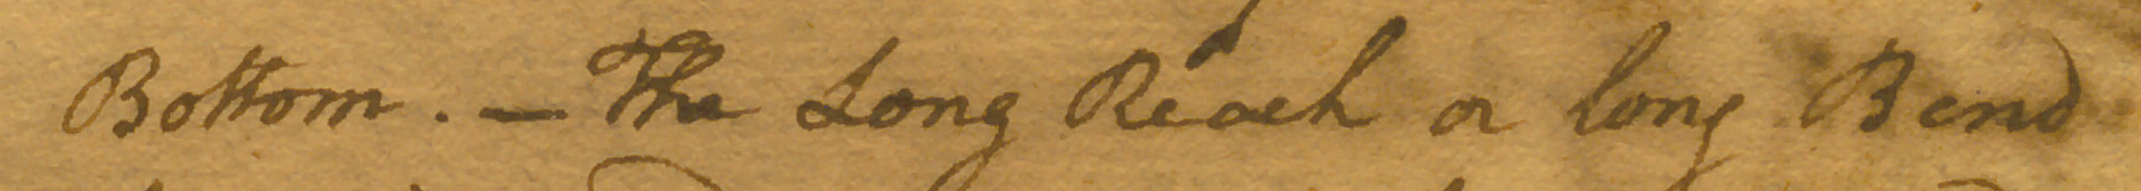Bottom.- The Long Reach or long Bend
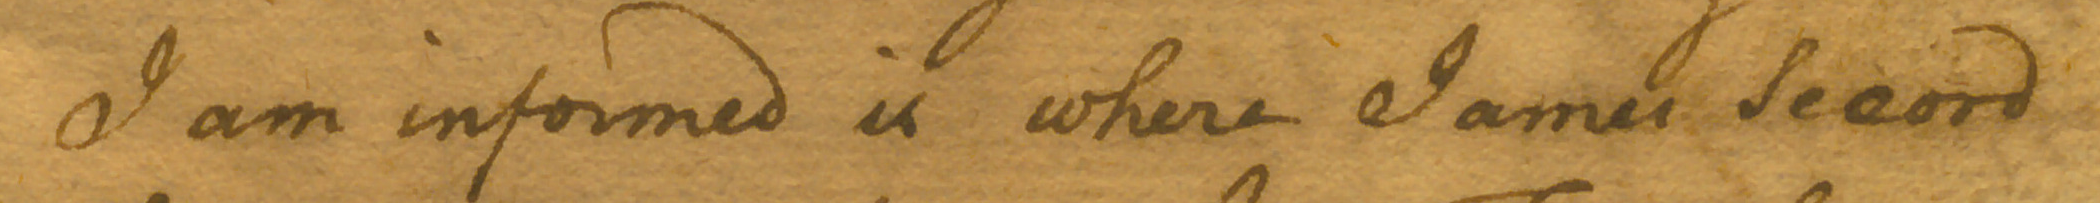I am informed is where James Secord
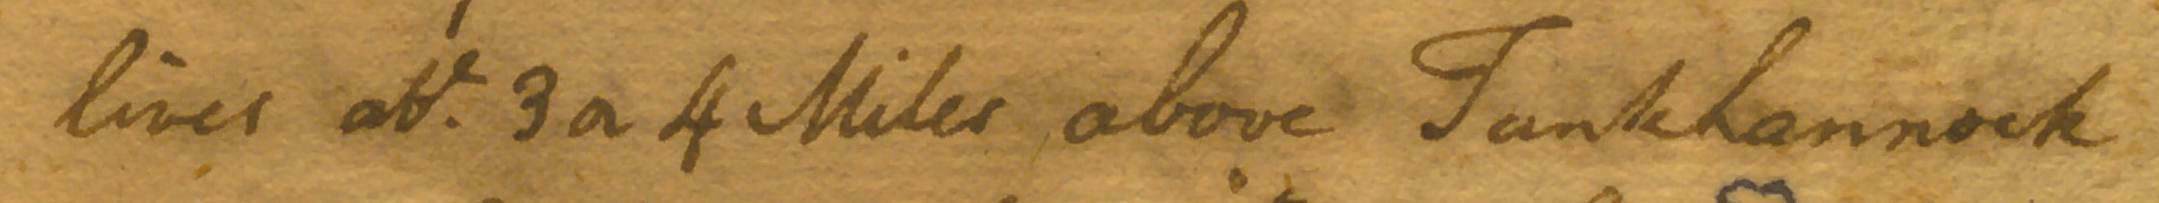lives ab^t. 3 or 4 Miles above Tunkhannock
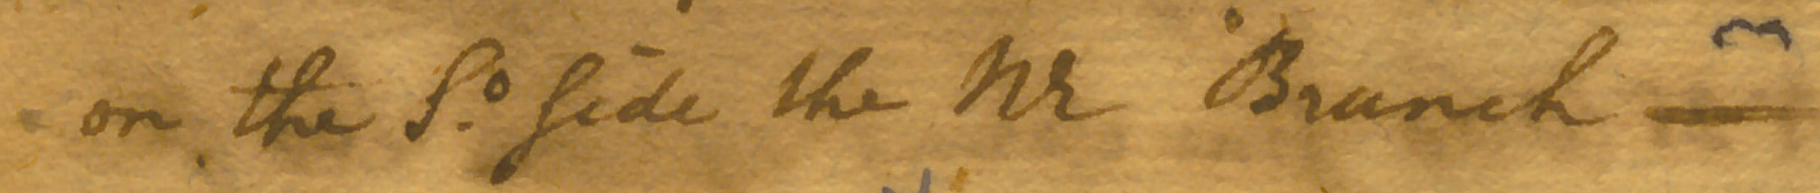on the s^o. side the NE Branch-
